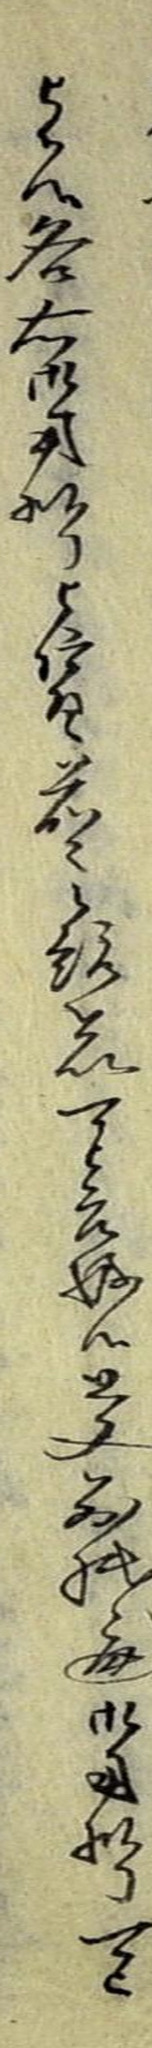被下候各右御用掛り被仰付候前々之趣を以可被取扱候且又別紙之通御用掛り可被
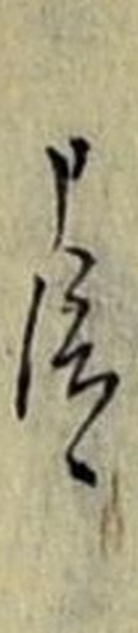申渡候
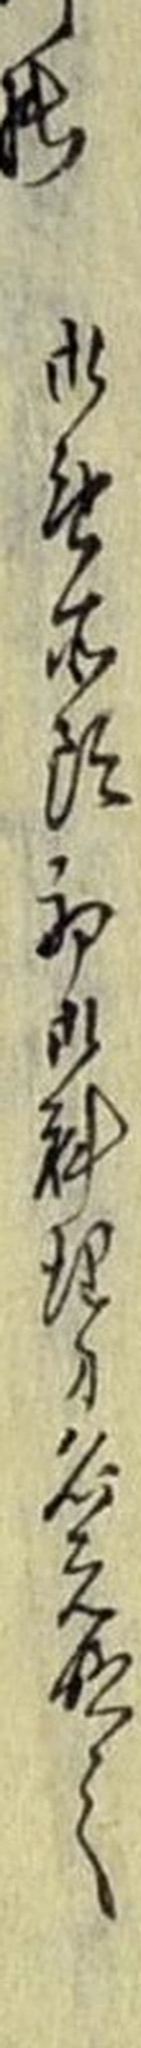別紙御座所頭初御料理方名元略之
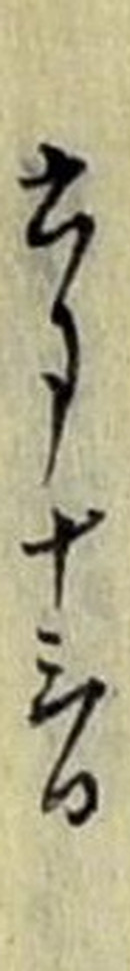六月十三日

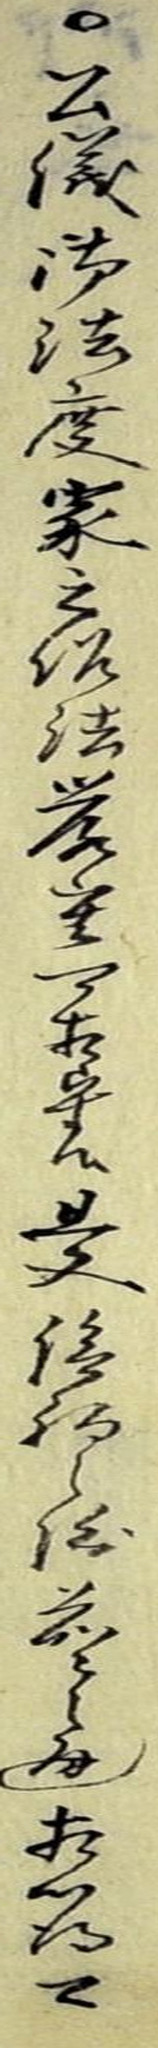○公儀御法度家之作法厳重可相守候倹約之儀前々之通相心得可
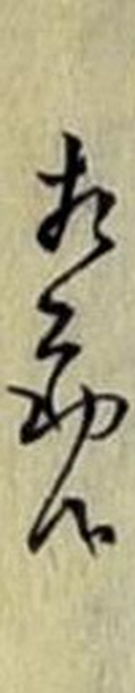相勤候
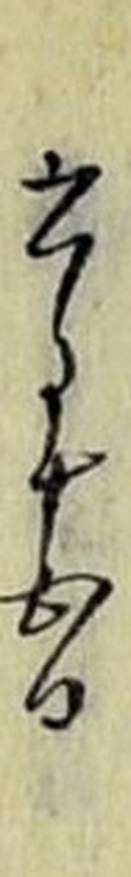六月十五日
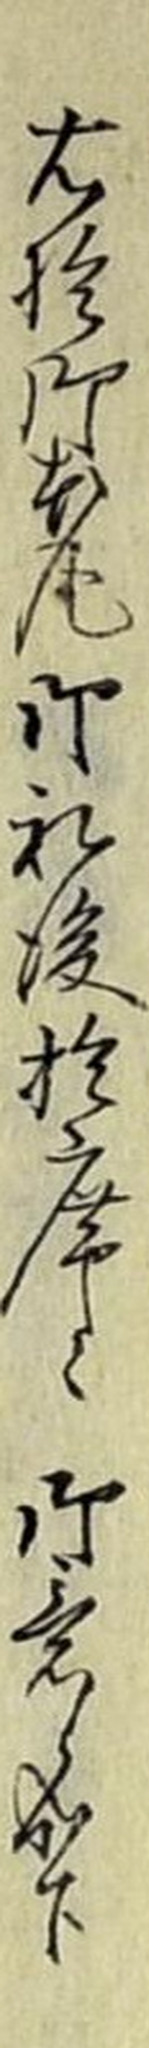右於御本丸御礼後於席々御意被成下
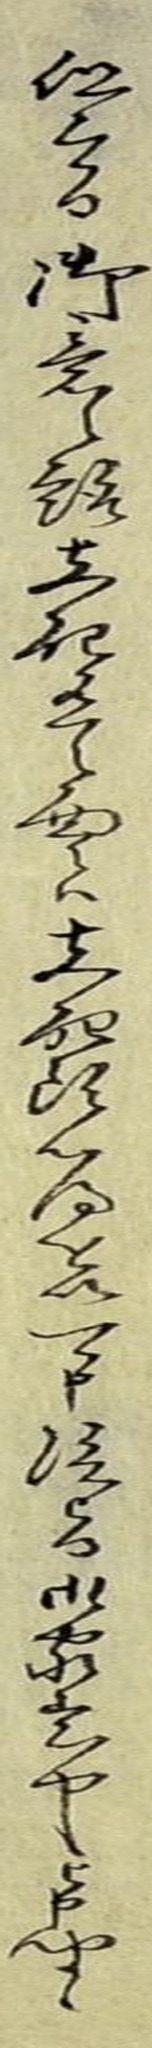但今日御意之趣支配有之面々は支配頭心得を以可申渡旨御家老中被申聞候
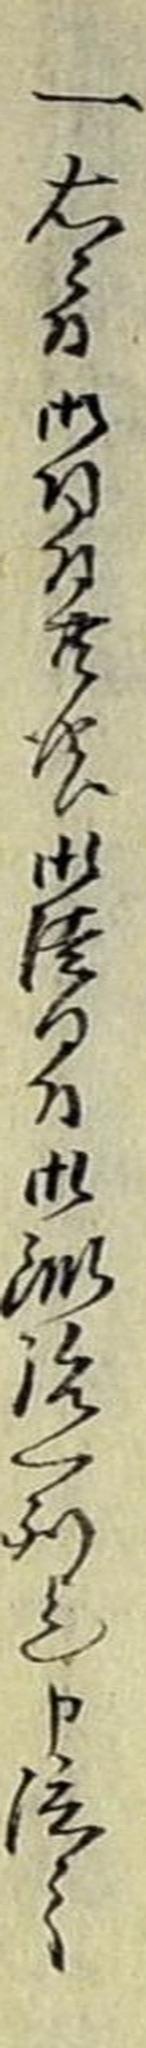一右に付御目付共儀は御徒目付御鍛冶一列迄申渡之
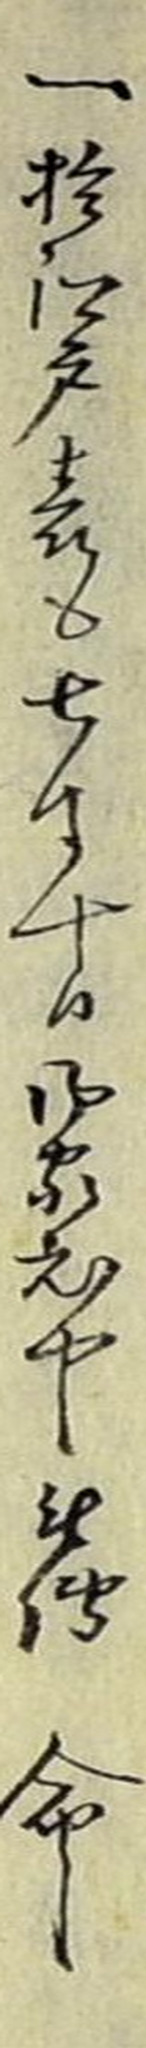一於江戸表も七月十日御家老中被伝命
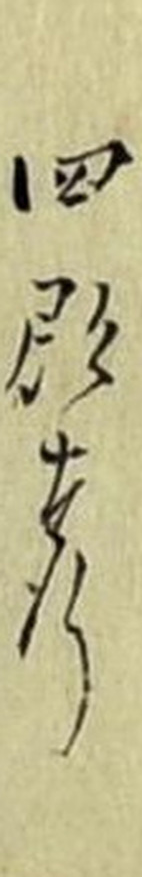四郡奉行
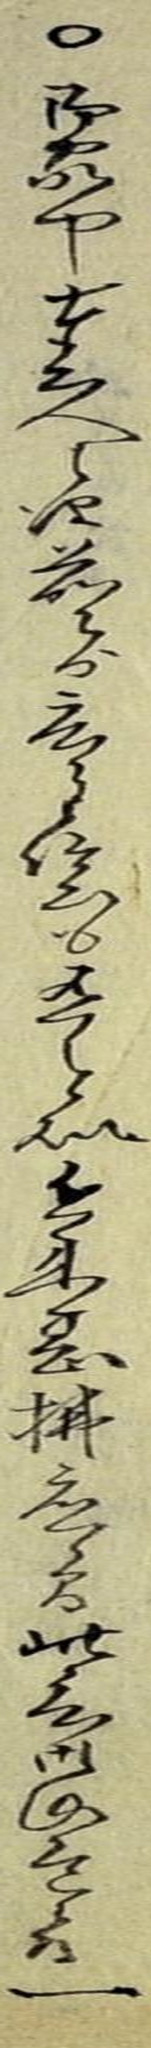○御家中奉公人之儀前々ゟ度々被仰出も有之候処近来甚払底候間此度御趣意に付一
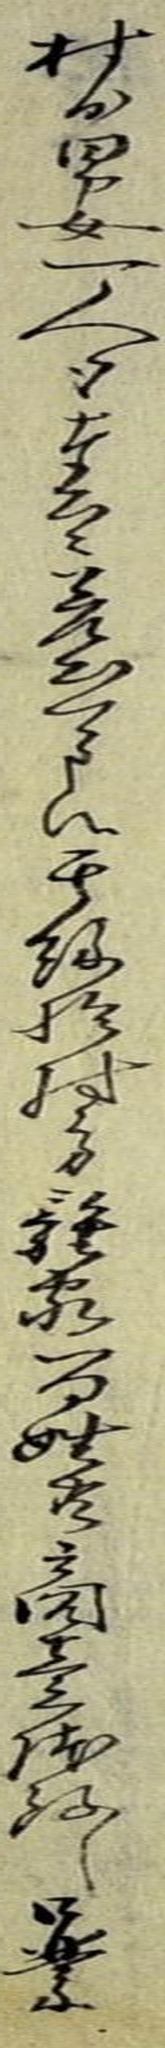村ゟ男女一人つヽ奉公に差出可申候其餘於村方離家百姓共商売体致し口業
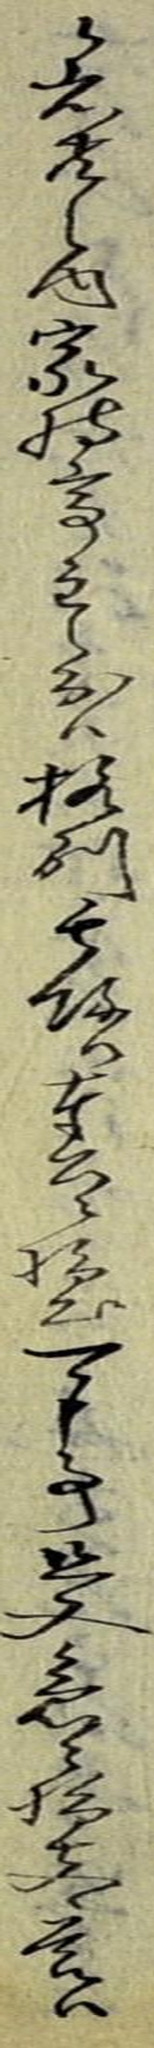候者共之内家持亭主之儀は格別其餘は奉公に差出可申事且又急に指支候節は
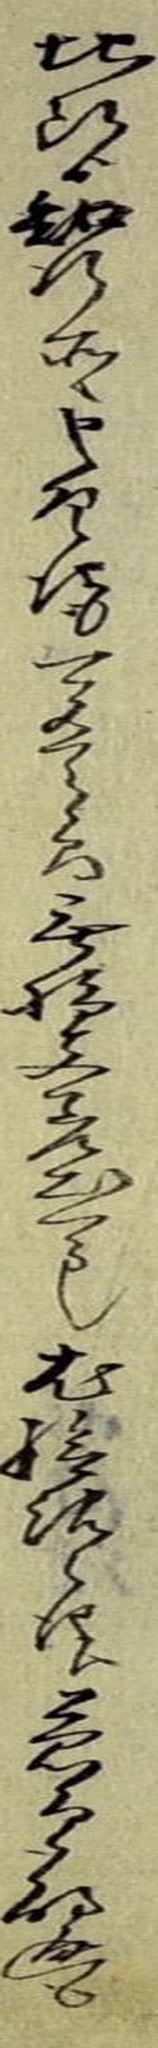地頭ゟ知行所へ申付候儀も可有之候間無指支差出可申候尤給銀之儀は兼而御触通も
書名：命令之部 六
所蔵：福井県文書館 Fukui Prefectural Archives
